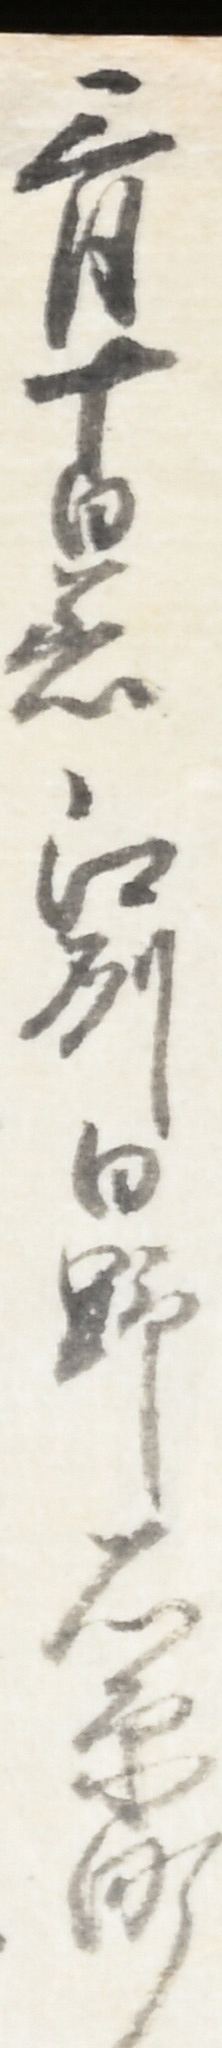三月十日着江州日野石原町
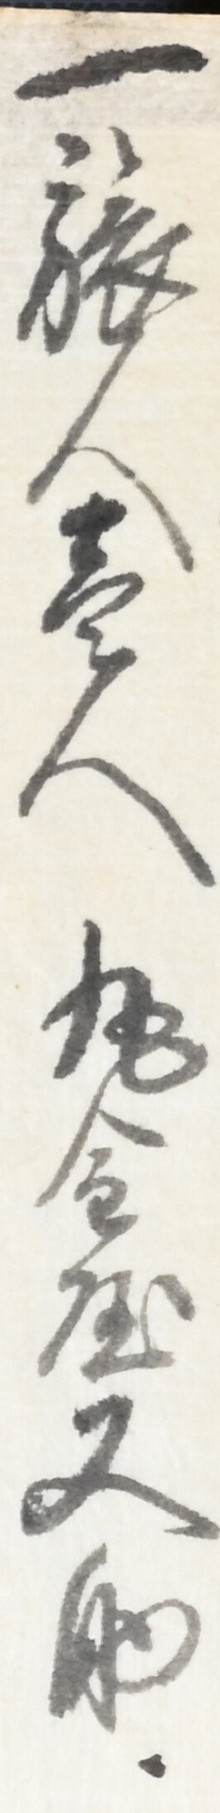一旅人壱人丸金屋又助・

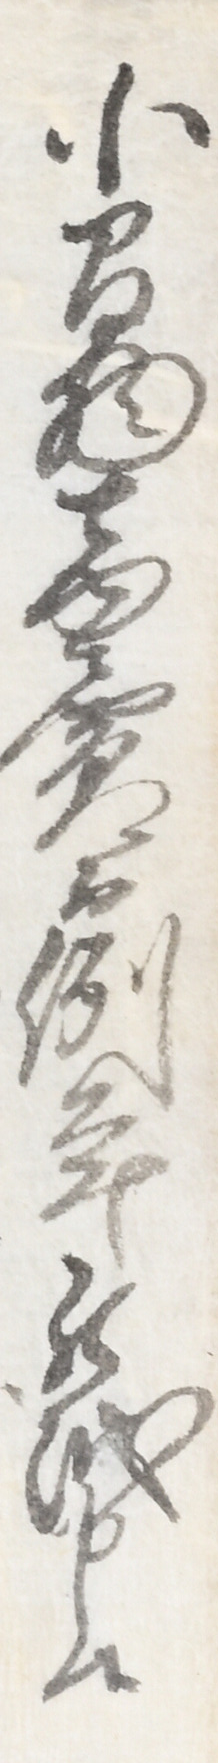小間物商売ニ而例年罷越申候
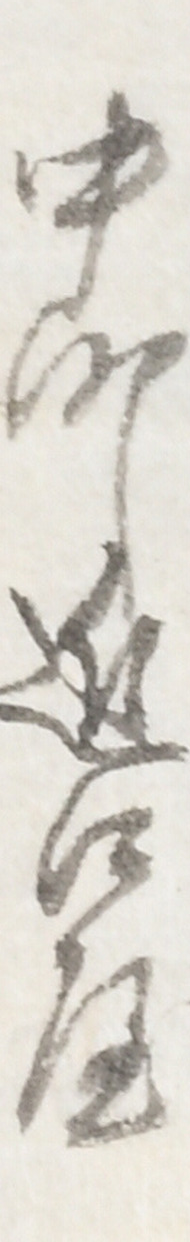中町近江屋
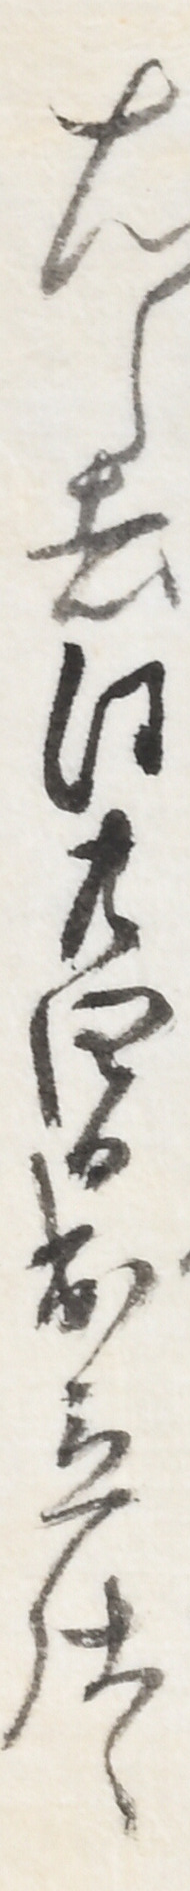右之者同廿四日出立仕候
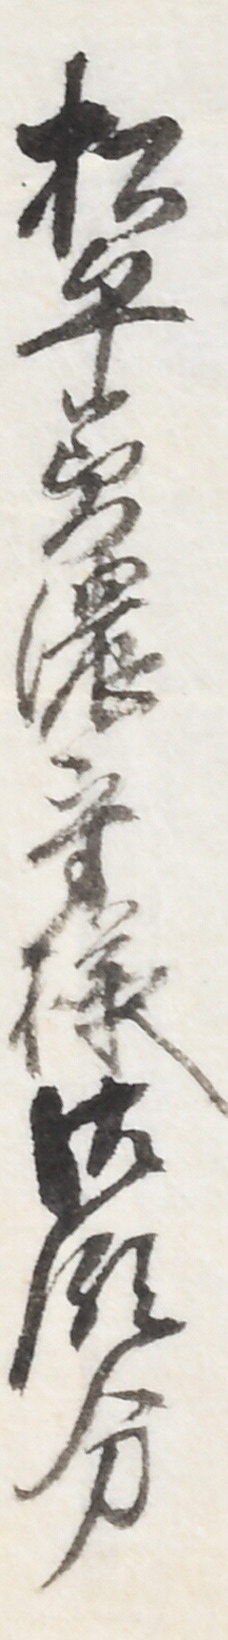松平美濃守様御領分
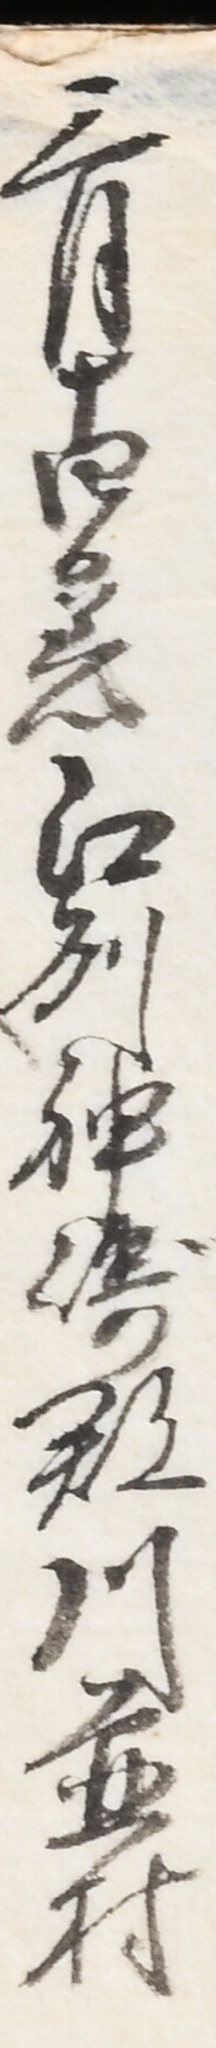三月十四日着江州神崎郡川並村
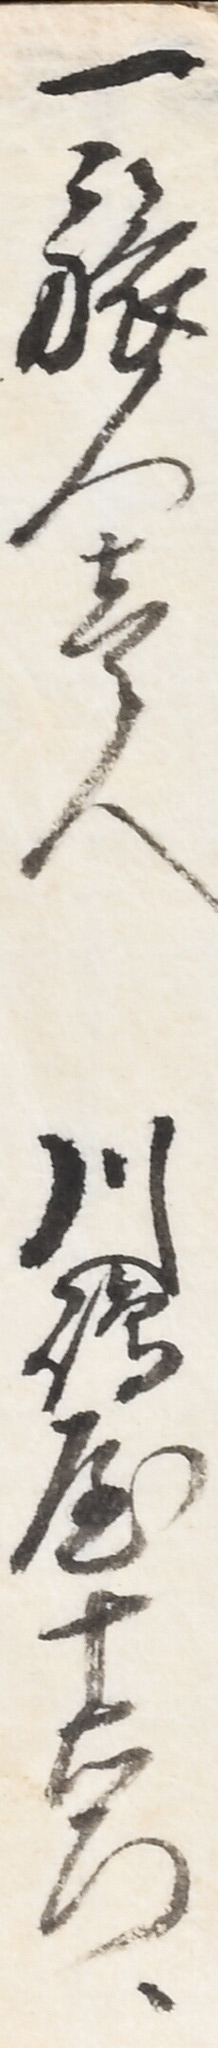一旅人壱人川嶋屋十右衛門・
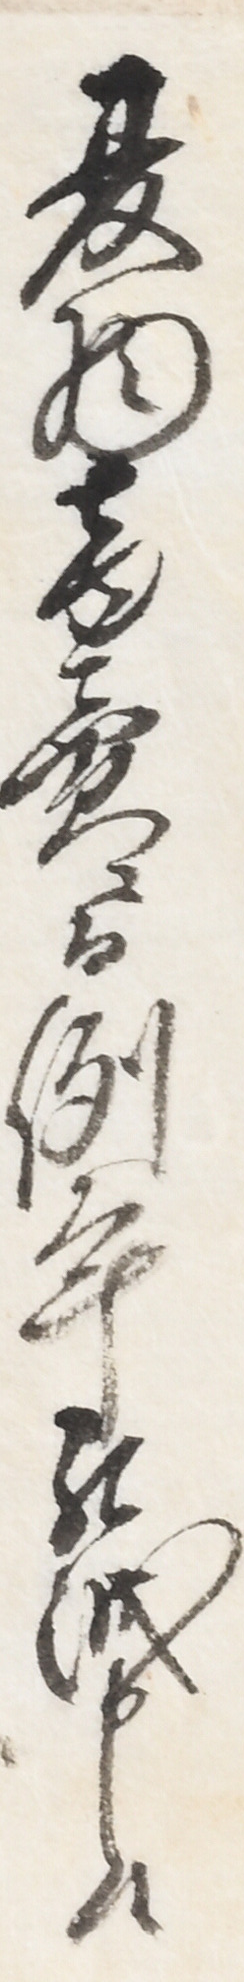夏物商売ニ而例年罷越申候
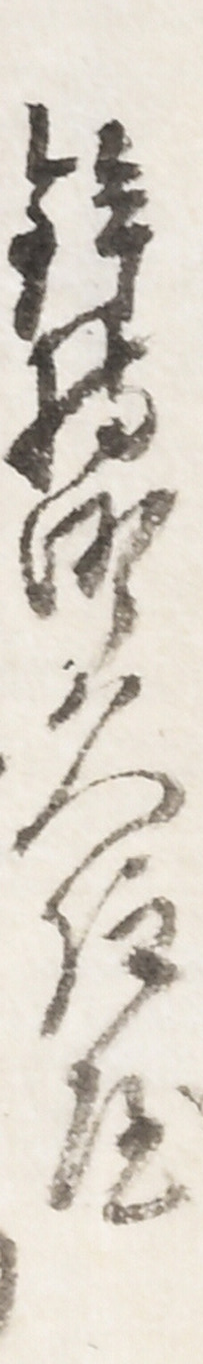鉾持町久住屋
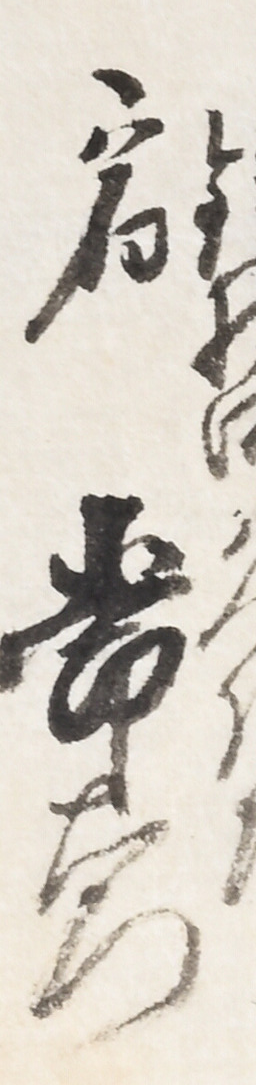宿常右衛門
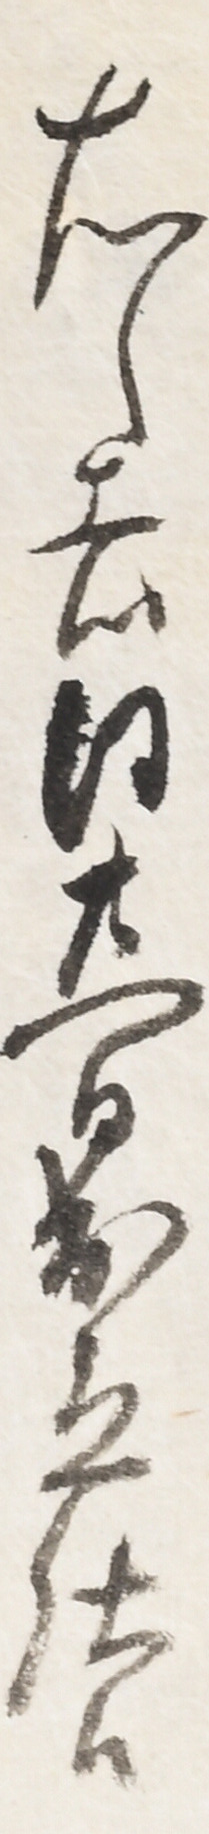右之者同廿一日出立仕候
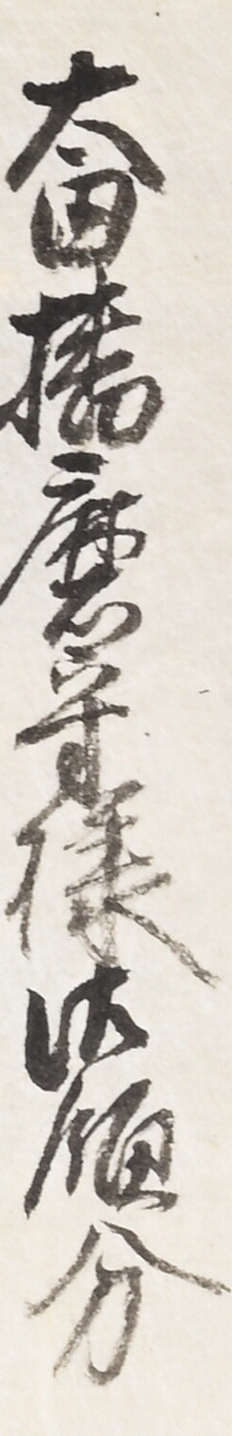太田播磨守様御領分
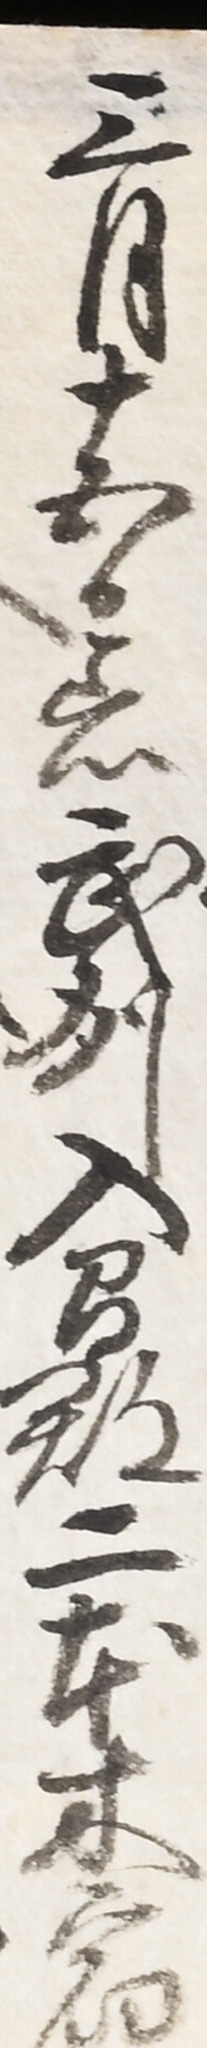三月十五日着武州入間郡二本木宿
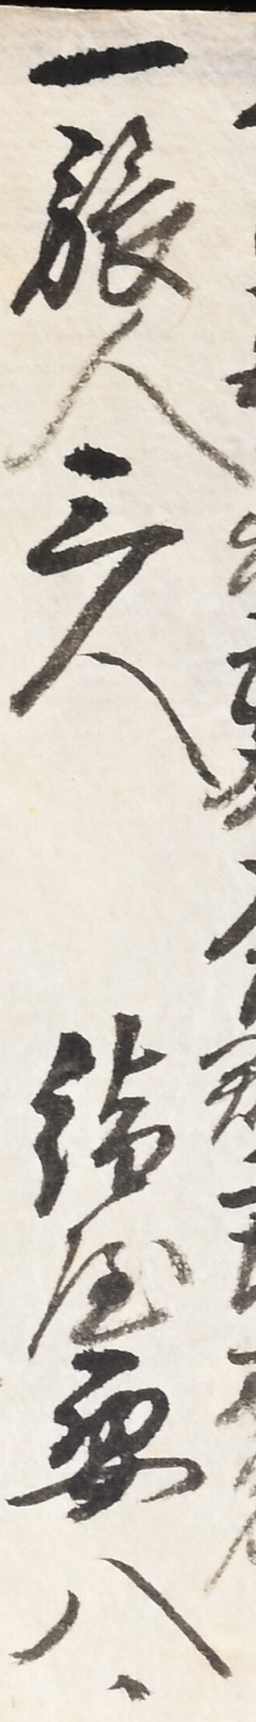一旅人三人絹屋要八・
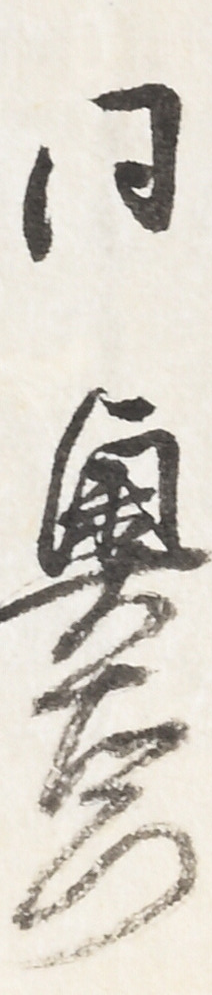同奥右衛門
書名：旅人泊控帳
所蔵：伊那市立高遠町図書館・合同会社AMANE
